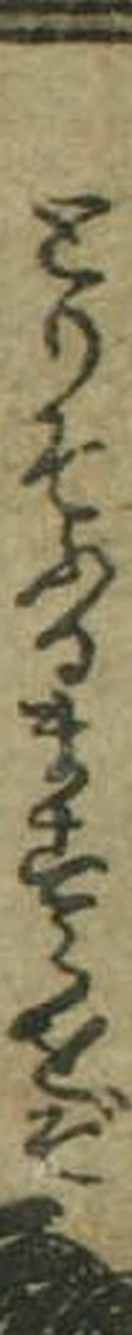とりそふるますらをぞ
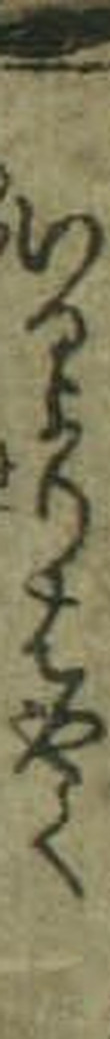いるよりはやく
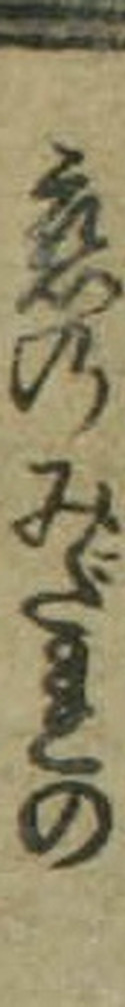恋のみだれの
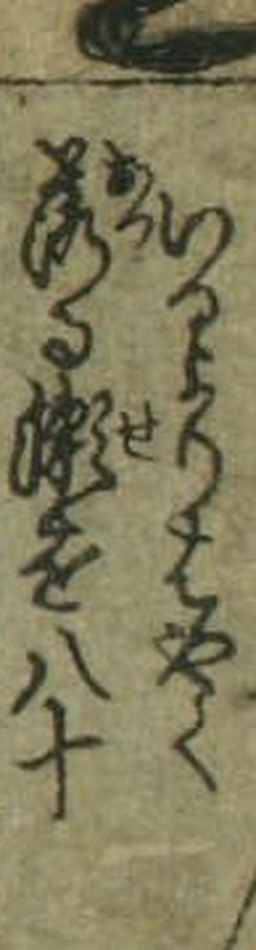落る瀬を八十
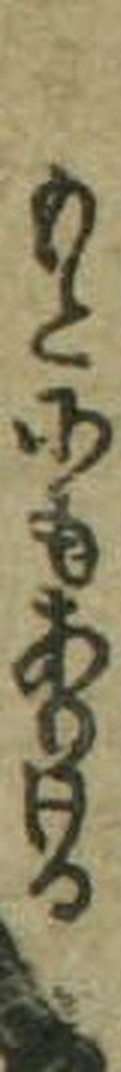もとにもありける
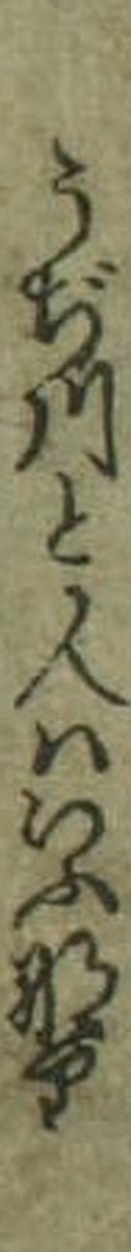うぢ川と人はいふなり
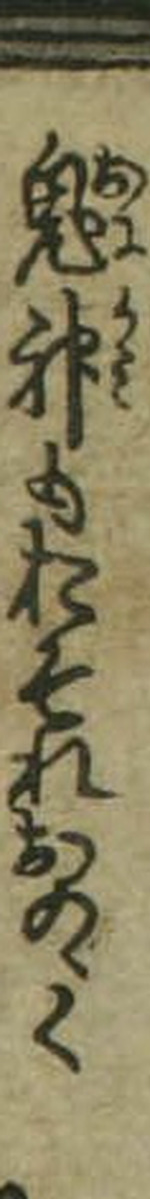鬼神もおそれおのゝく
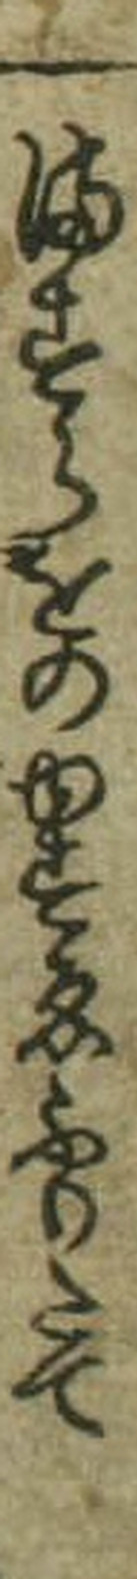ますらをのゆすゑふりたて
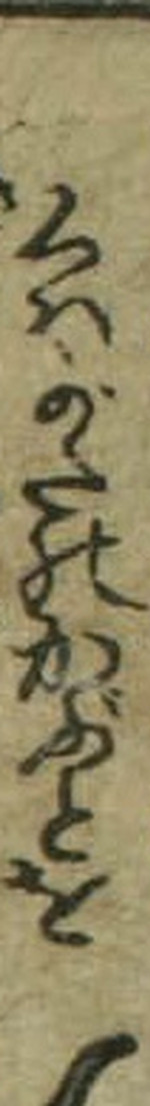くはがたのかぶとを
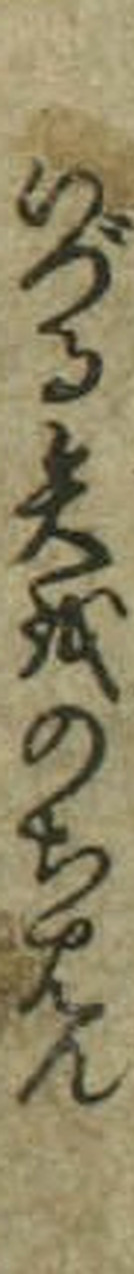いづる矢をのち見ん
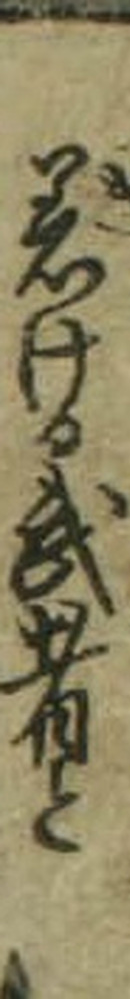着ける武者と
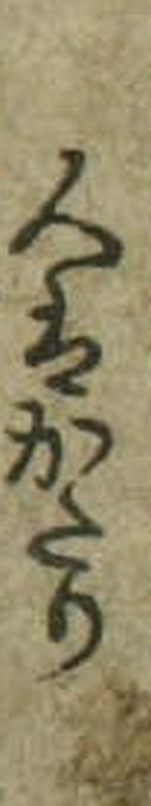人はかたり
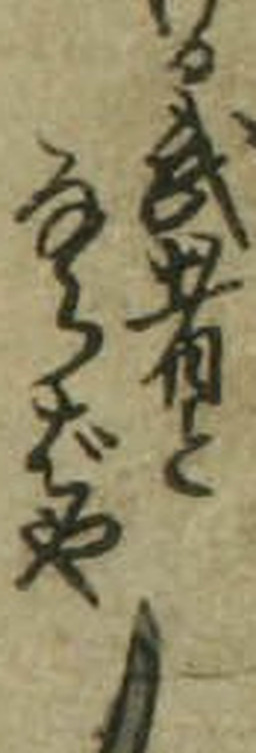ならばや
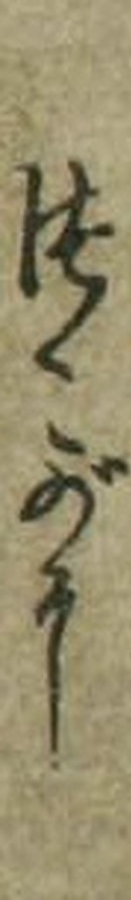つくがに
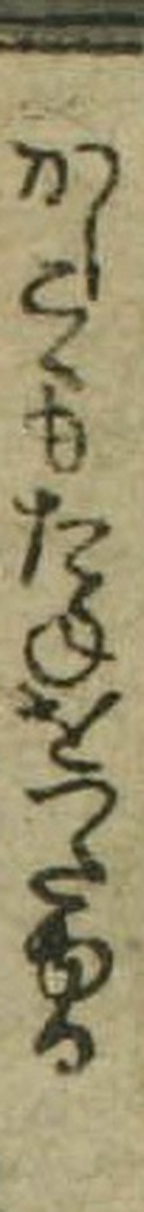かしこくもたねをつたゆる
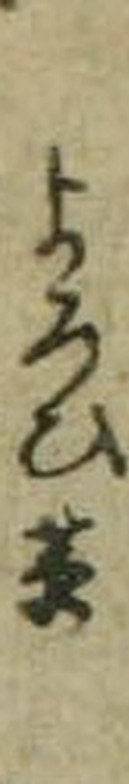よろひ草
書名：續英雄百人一首
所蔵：東京学芸大学附属図書館
